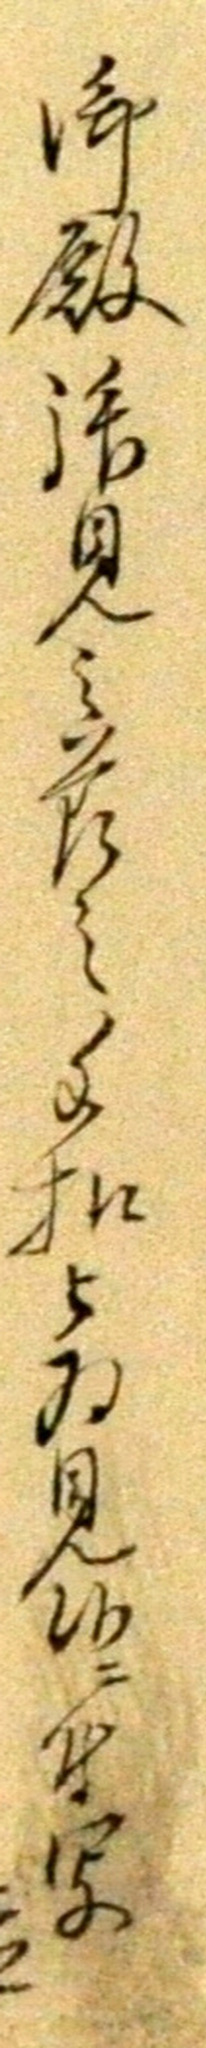御殿拝見之節之手扣被為見候ニ付写置

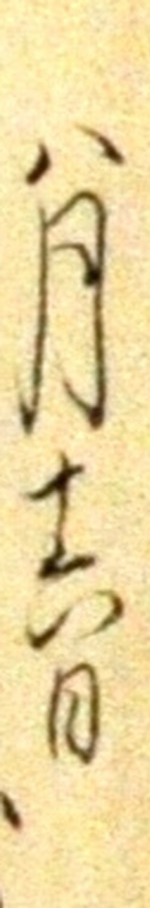八月十六日
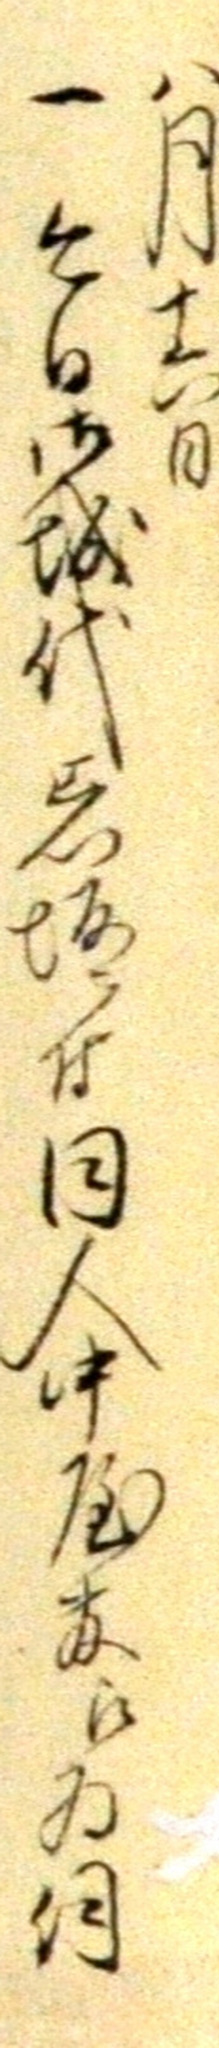一今日御城代着二付同人中屋敷え為伺
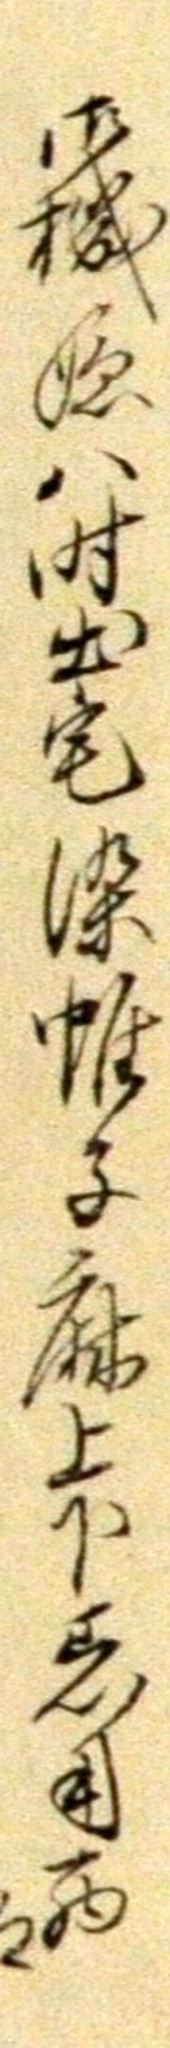御機嫌八時出宅染帷子麻上下着用西郷
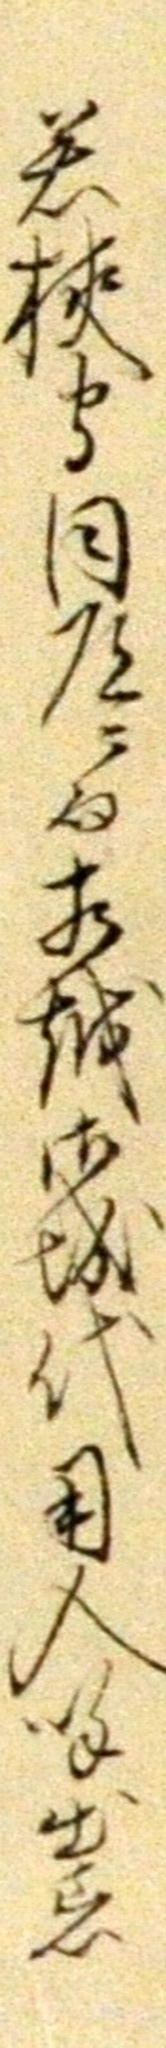若狭守同道ニ而相越御城代用人呼出着
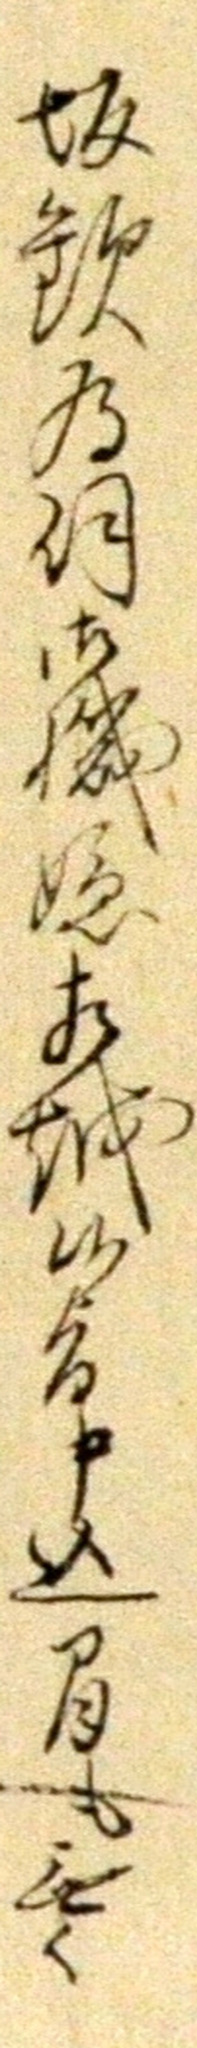坂歎為伺御機嫌相越候旨申込間も無く
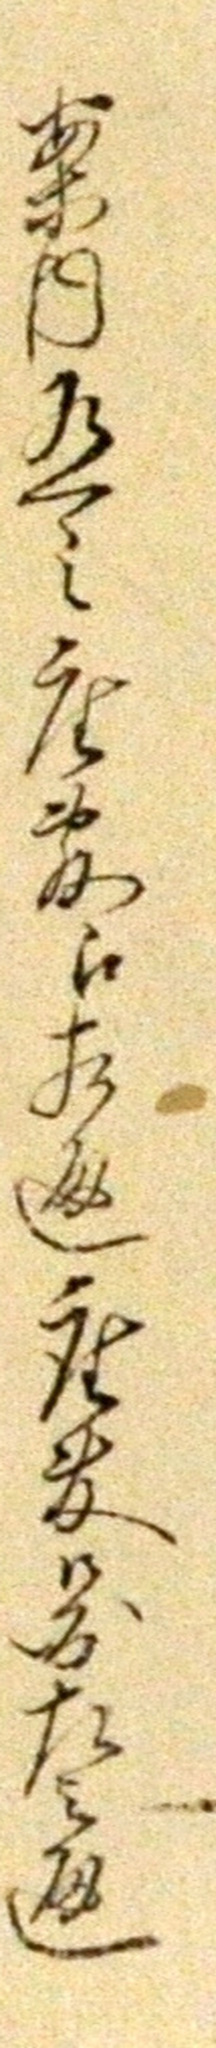案内有之座敷え相通座敷図左之通
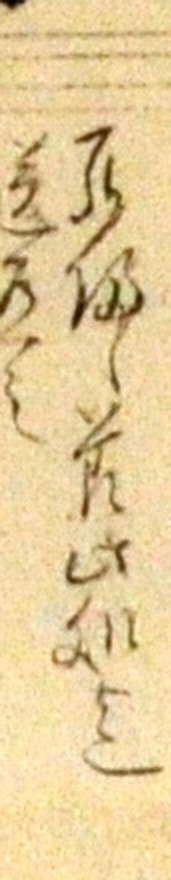罷帰候節此処迄
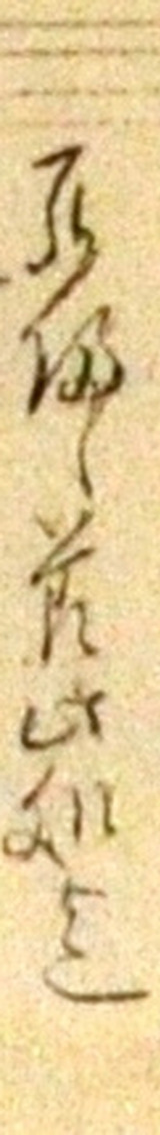罷帰候節此処迄

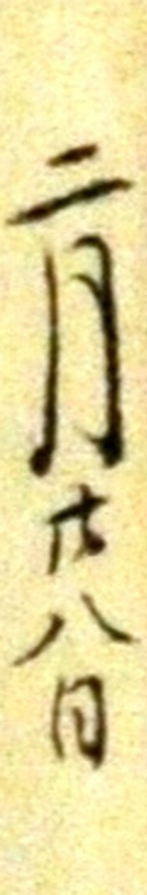二月廿八日
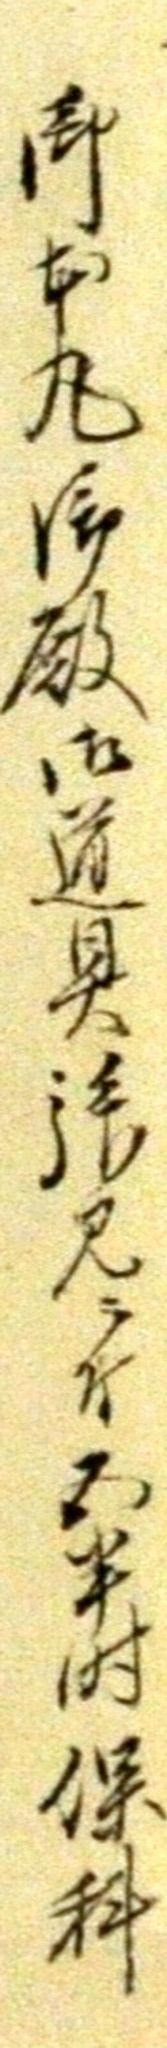御本丸御殿御道具拝見ニ付五半時保科
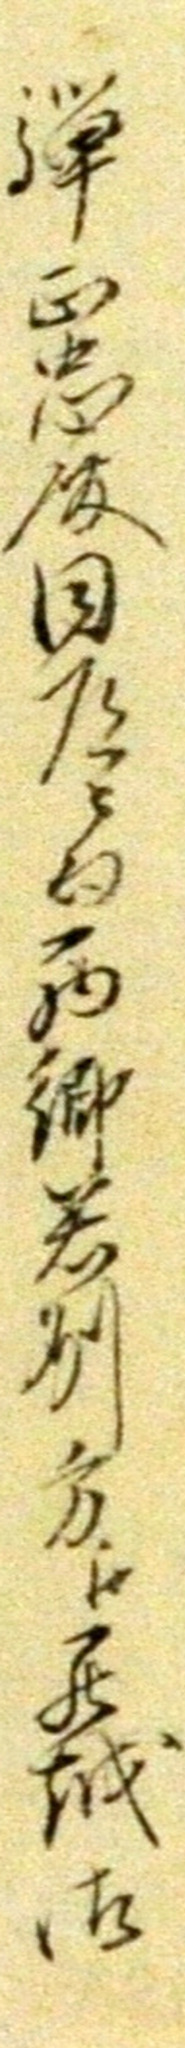弾正忠殿同道ニ而西郷若州方え罷越御
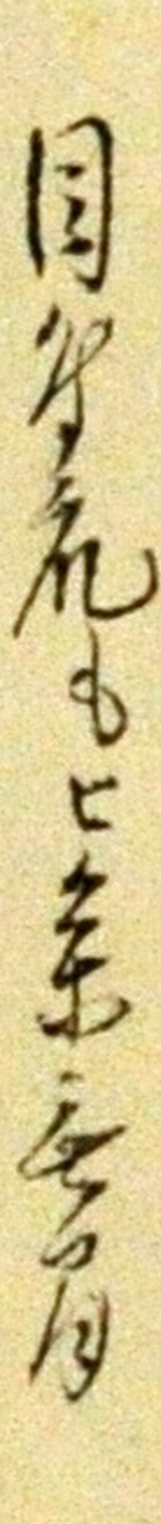目付衆も被参無間
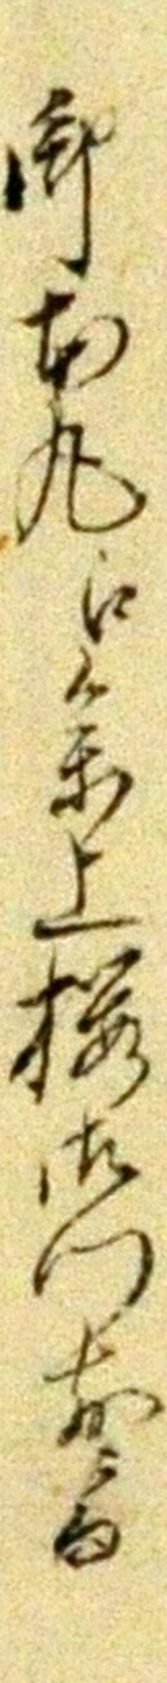御本丸え参上楼御門前ニ而
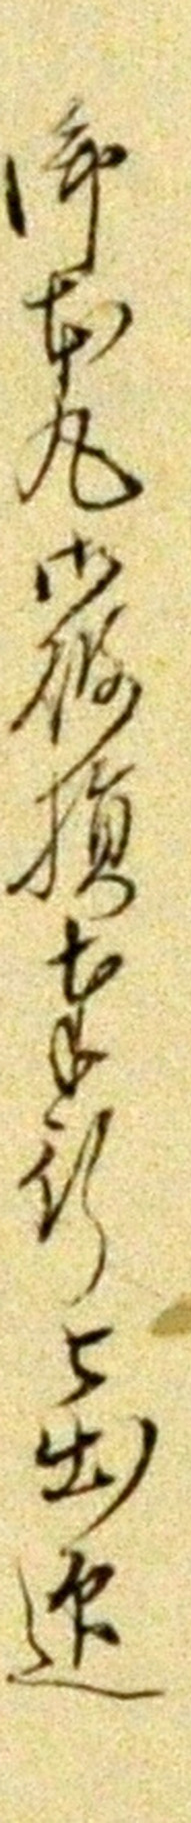御本丸御破損奉行被出迎
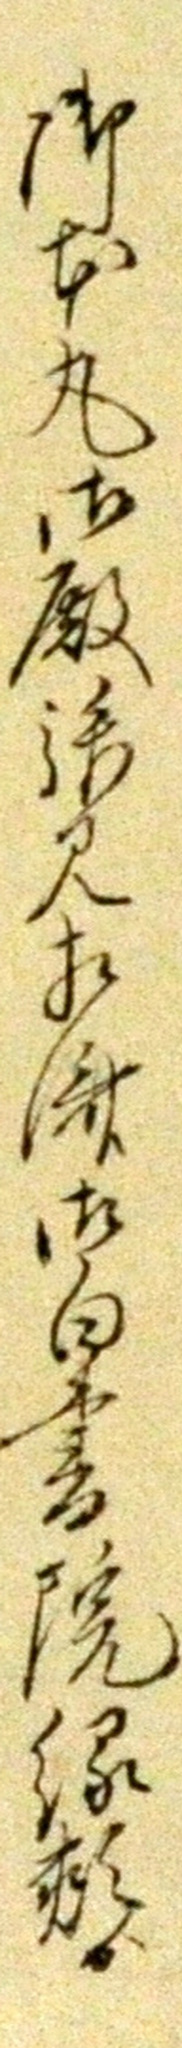御本丸御殿拝見相済御白書院縁頬ゟ
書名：大阪加番関係諸書留〔一括〕
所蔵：伊那市立高遠町図書館・合同会社AMANE
